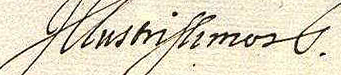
Jllustrissimos S.res
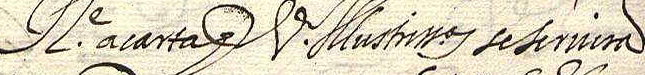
R.e a carta q̄ V. Illustriss.as se seruirã
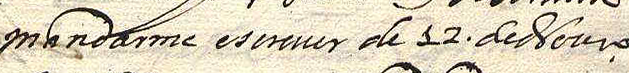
mandarme escreuer de 12. de Nouro.
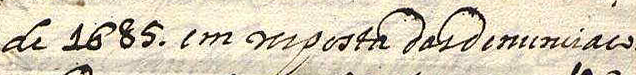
de 1685. em resposta das denunciaco
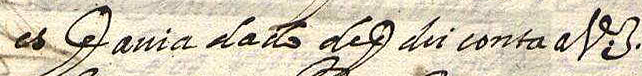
es q̄ auia dado de q̄ dei conta a V. S.
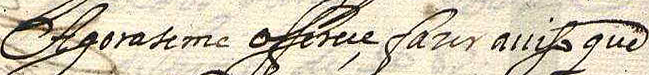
Agora se me offereçe fazer auiso que
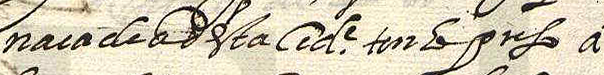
na cadea desta cid.e tenho preso á
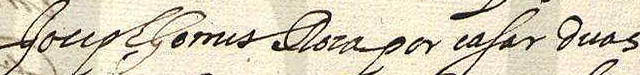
Jozeph Gomes Roza por casar duas
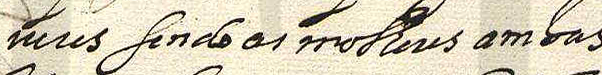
uezes sendo as molheres ambas
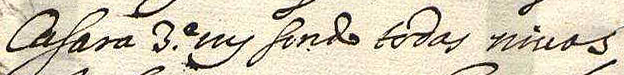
Casara 3.a ues sendo todas uiuas,
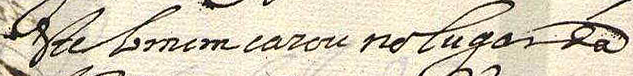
este homem cazou no lugar da
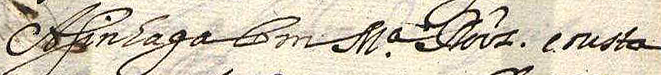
Asinhaga Com M.a Roīz. e nesta
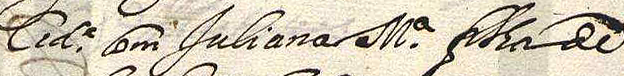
Cid.e Com Juliana M.a filha de
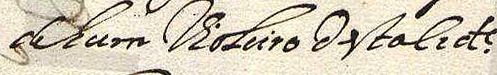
de hum VioLeiro desta Cid̄e.
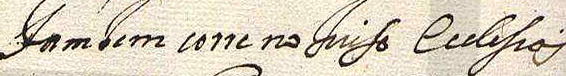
Tambem corre no Iuizo Ecclesias
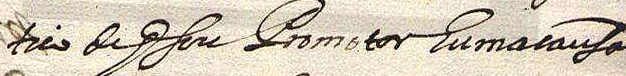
tico de q̄ sou Promotor huma causa
